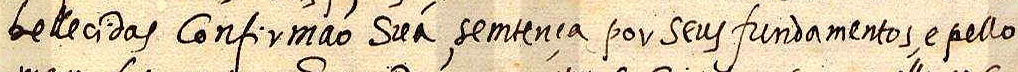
bellecidas Confirmaõ Sua semtença por seus fundamentos, e pello
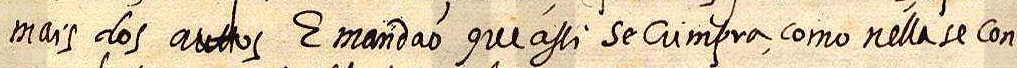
mais dos auttos E mandaõ que assi se cumpra, como nella se con
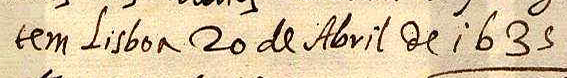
tem Lisboa 20 de Abril de i635
